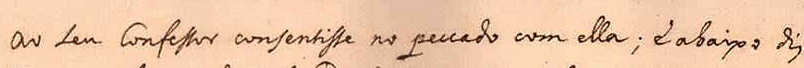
ao seu Confessor consentisse no peccado com ella; e abaixo dis
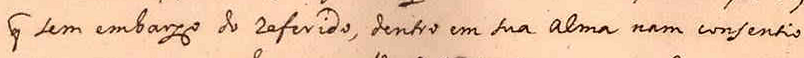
q̄ sem embargo do referido, dentro em sua alma nam consentio
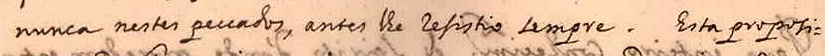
nunca nestes peccados, antes lhe Resistio sempre. Esta proposi
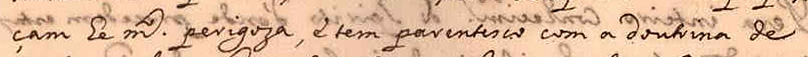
çam he mto. perigoza, e tem parentesco com a doutrina de
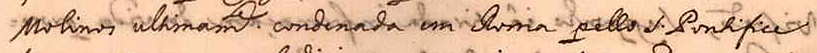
Molinos ultimam.te condenada em Roma pello S. Pontifice
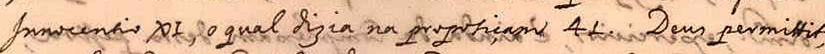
Jnnocentio XI, o qual dizia na proposiçam 41. Deus permittit,
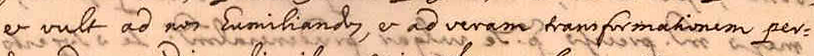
et vult ad nos humiliandos, et ad veram tranformationem per
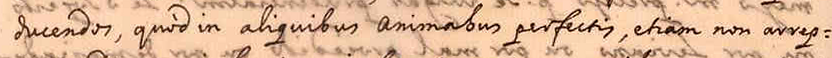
ducendos, quod in aliquibus animabus perfectis, etiam non arrep
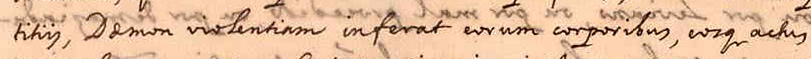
titiis, Dæmon violentiam inferat eorum corporibus, eosq actus
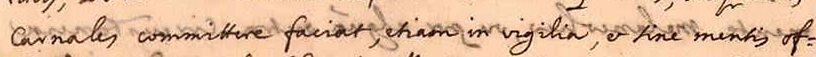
carnales committere faciat, etiam in vigilia, et sine mentis of
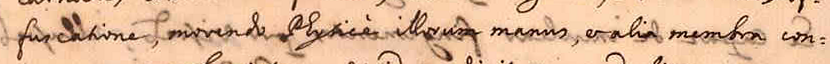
fuscatione, movendo Physice illorum manus, et alia membra con
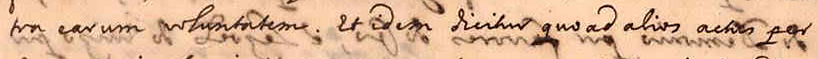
tra earum voluntatem. Et idem dicitur quo ad alios actus per
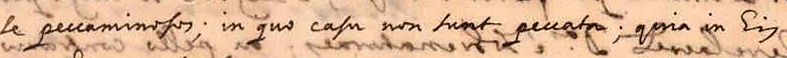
se peccaminosos; in quo casu non sunt peccata; quia em his
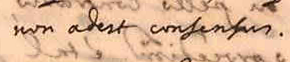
non ad est consenusus.
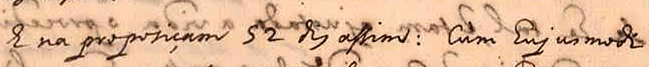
E na proposiçam 52 dis assim: Cum hujus modi
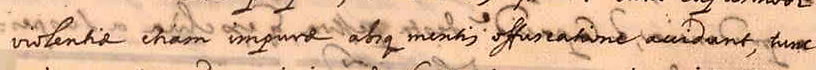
violentiæ etiam impuræ absq mentis offuscatione accidunt, tunc
